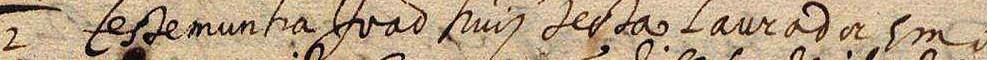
item testemunha Joaõ Nuiz̄ testa Laurador E mo
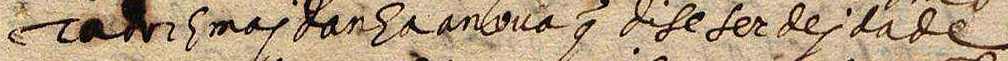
rador Em a jdanha a noua q̄ dise ser de jdade
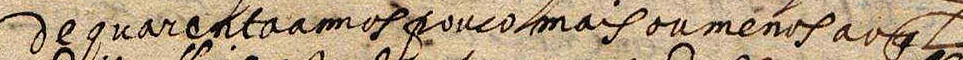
de quarenta annos pouco mais ou menos ao q̄L
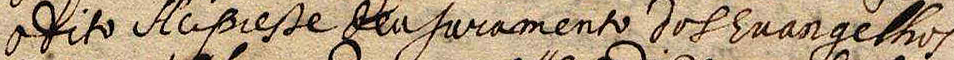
o dito Acipreste deu Juramento dos Euangelhos
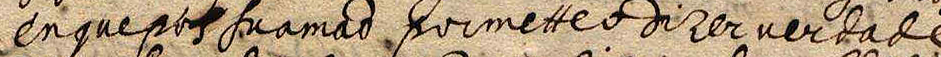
en que pos sua maõ pormetteo dizer uerdade
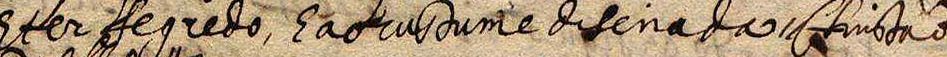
E ter segredo, E ao custume dise nada // Christaõ
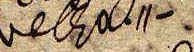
Velho. // -
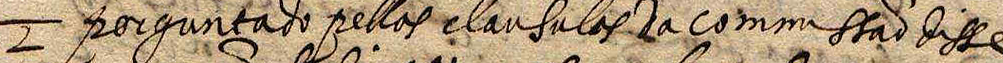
item perguntado pellas clausulas da commissaõ disse
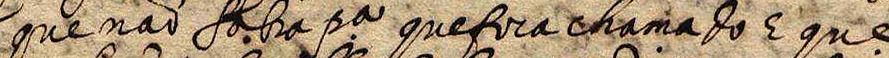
que naõ sabia p.a que fora chamado E que
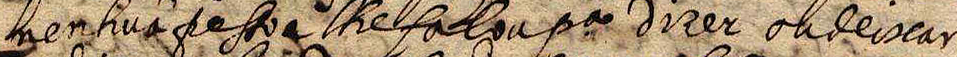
nenhuā pessoa lhe falou p.a dizer ou deixar
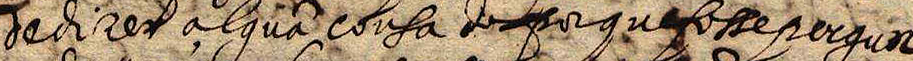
de dizer alguā cousa do porque fosse pergun
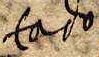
tado
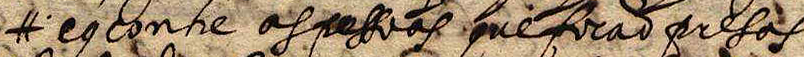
e q̄ conhe as pessoas que foraõ presas
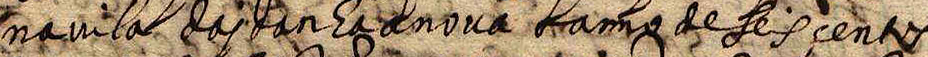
na uila da jdanha a noua o anno de seisçentos
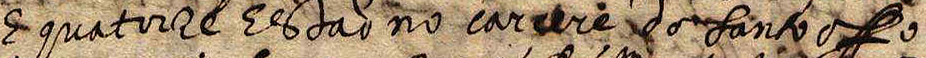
E quatorze E estaõ no carçere do santo offo
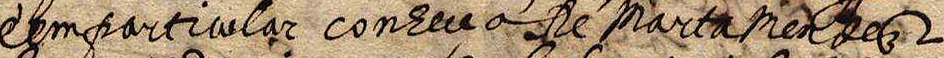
e em particular conheçe a Ré Marta Mendez
